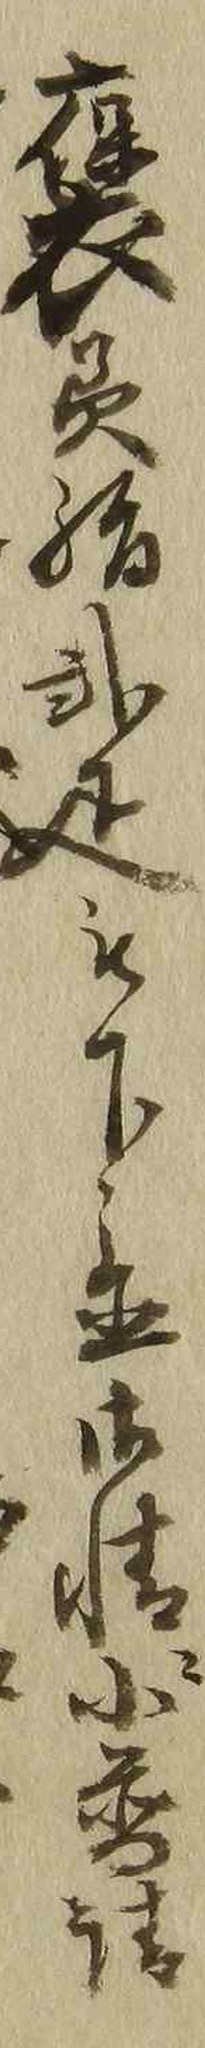褒美絹弐疋被下置御情ニ小普請
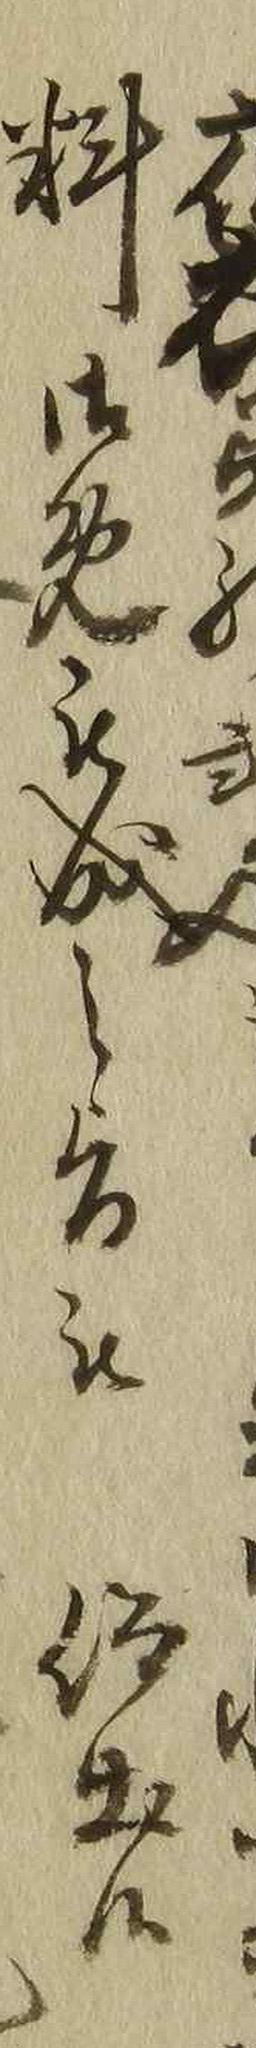料御免被成候旨被仰出候
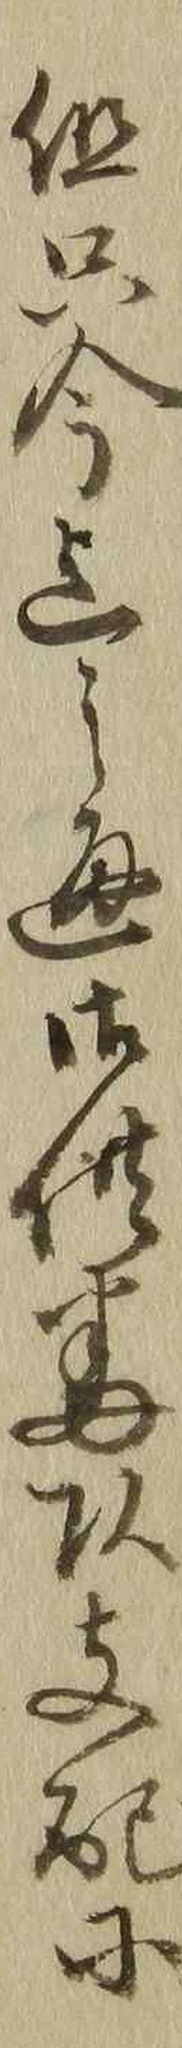但只今迄之通御供番頭支配に
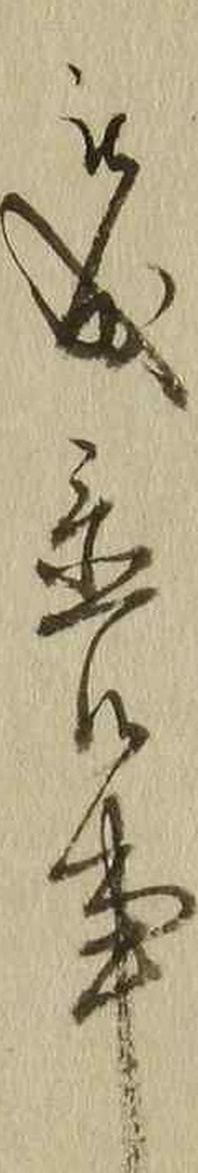被成置候事
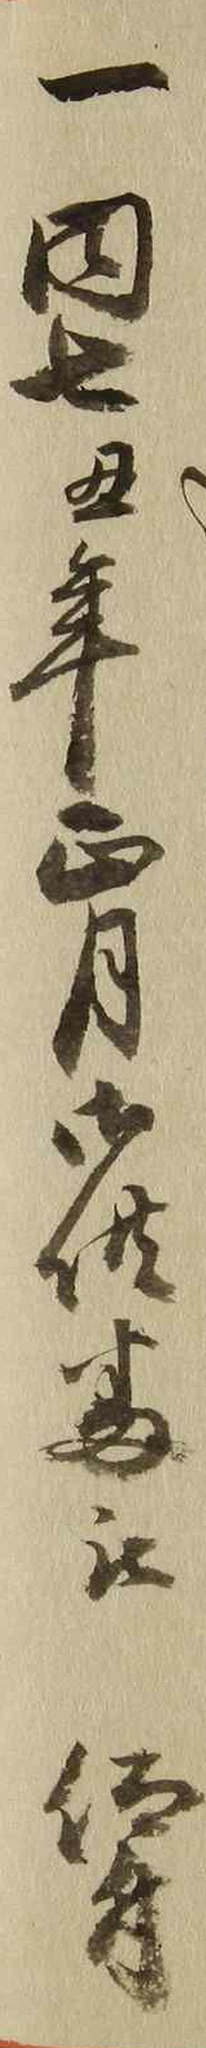一同七丑年正月御供番被仰付
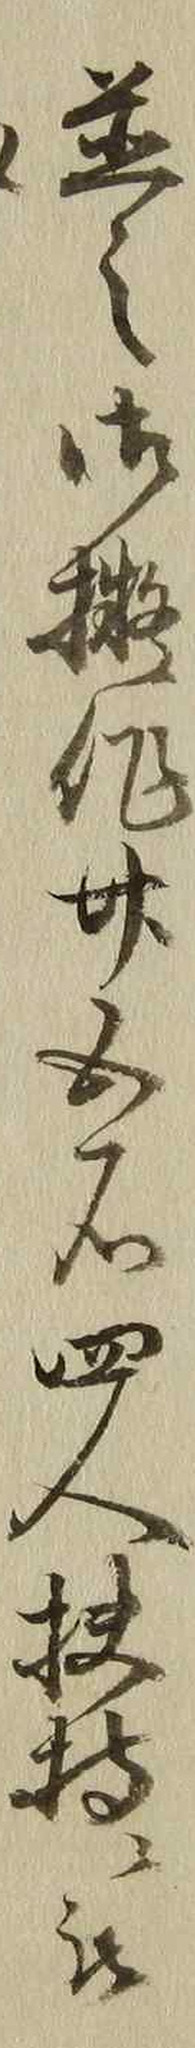並之御擬作廿五石四人扶持ニ被
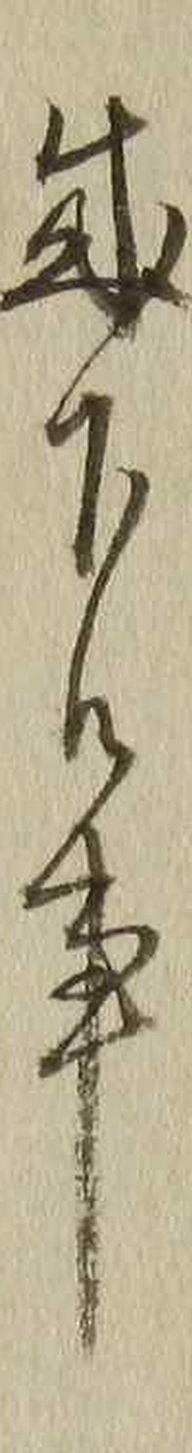成下候事
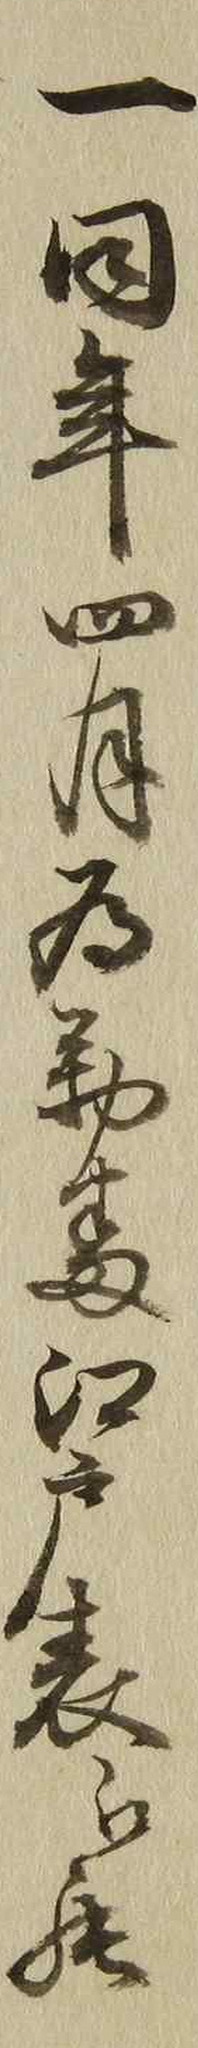一同年四月為勤番江戸表江罷
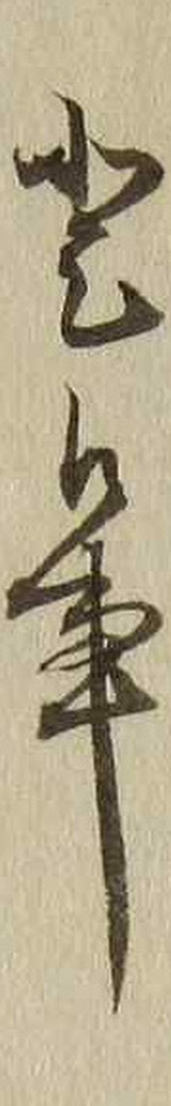登候事
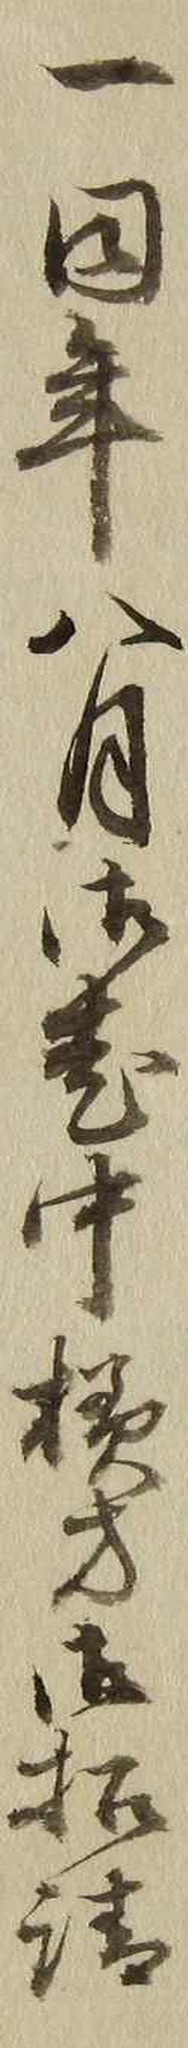一同年八月御老中様方御招請
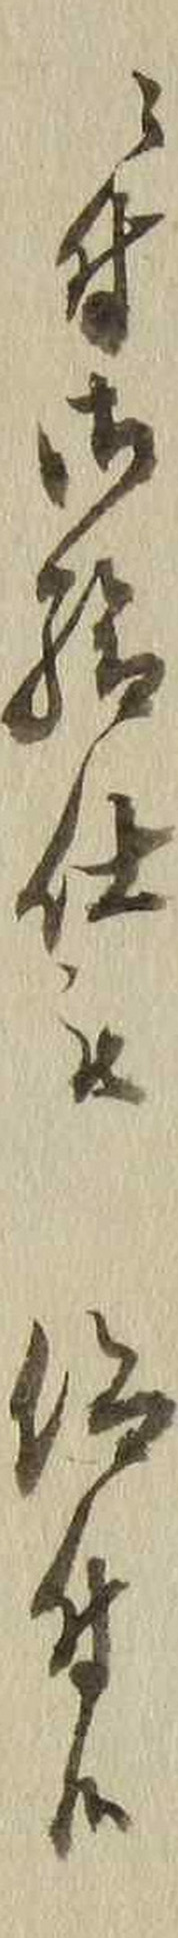ニ付御給仕被仰付候
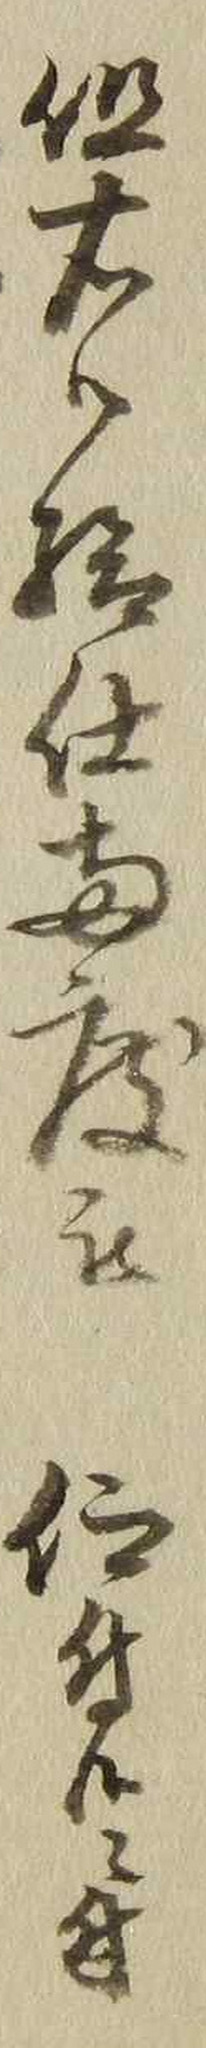但右御給仕両度被仰付候ニ付
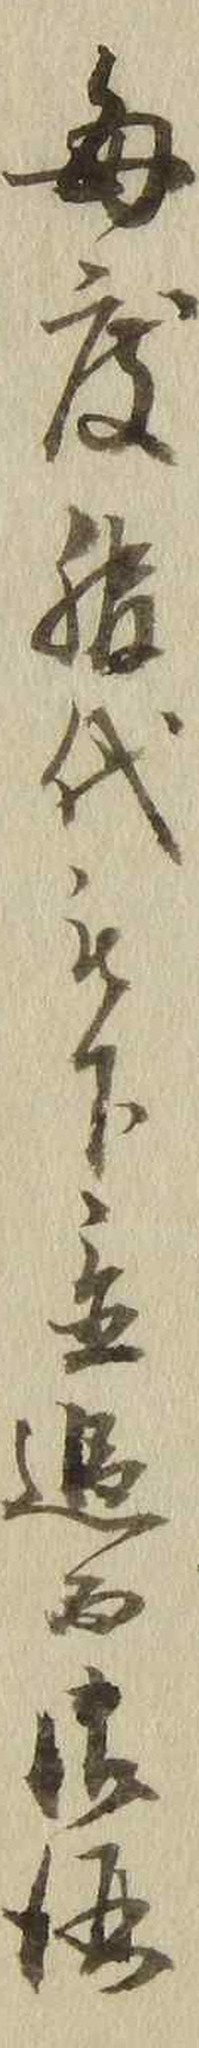毎度服代被下置追而御酒
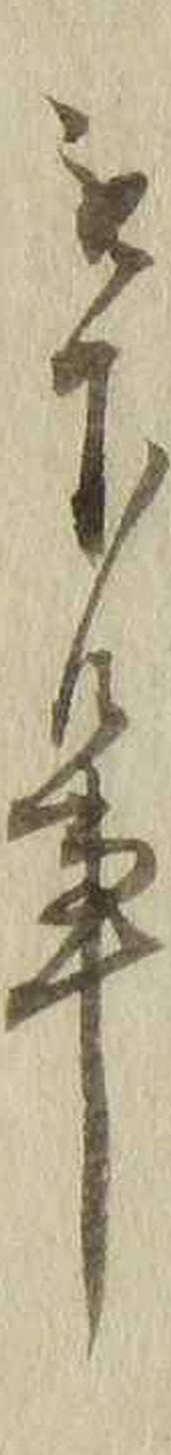被下候事
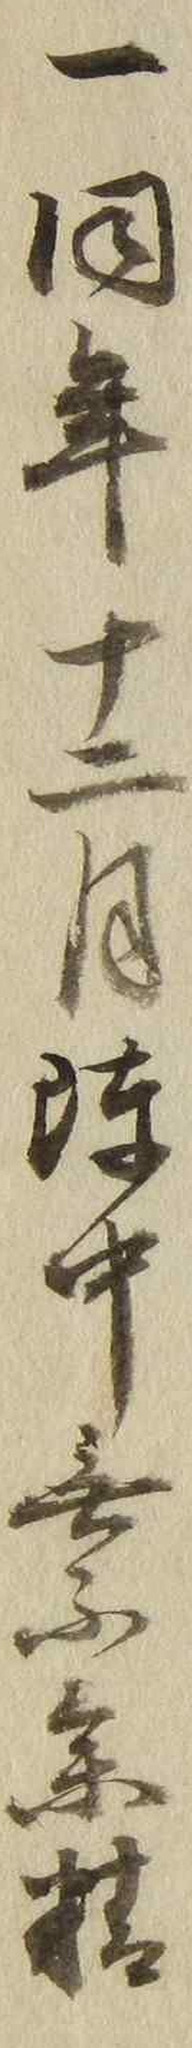一同年十二月陣中無不参精

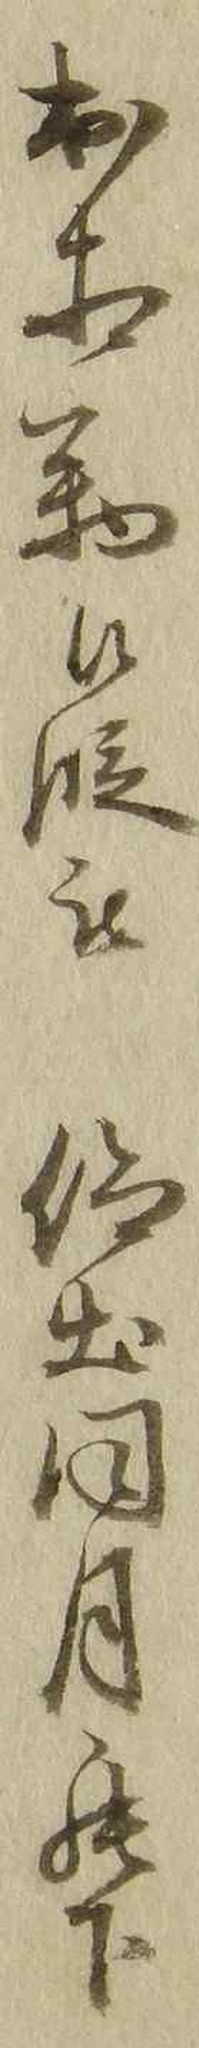出相勤候段被仰出同月罷下
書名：諸士系譜　巻之64　と之部7
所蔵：会津若松市立会津図書館
